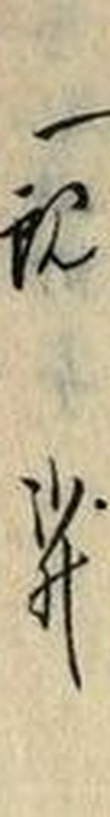蜆弐升
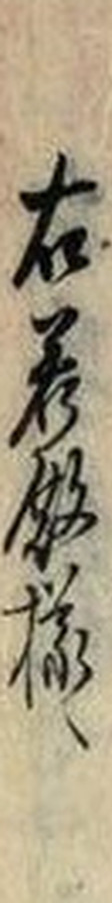右若殿様へ
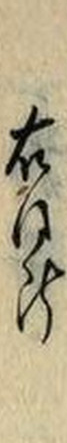右同断
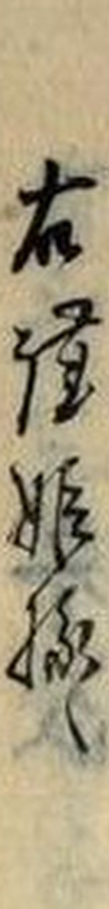右謹姫様へ

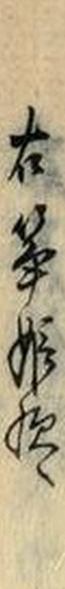右箏姫様へ
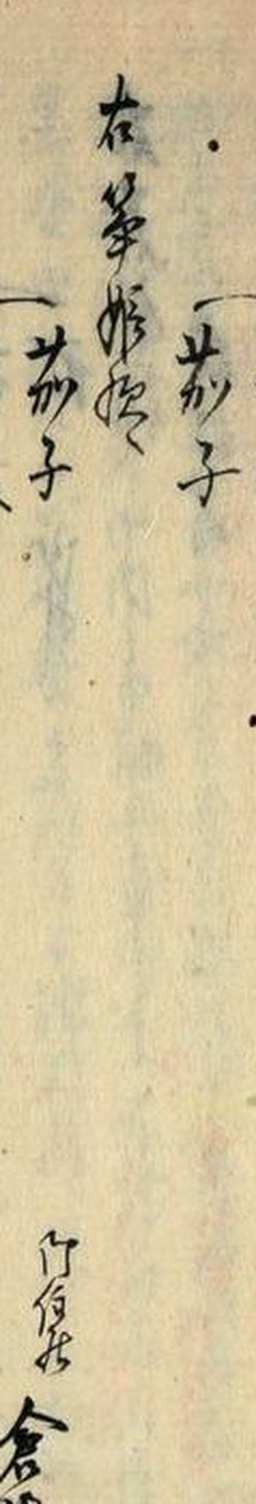右箏姫様へ
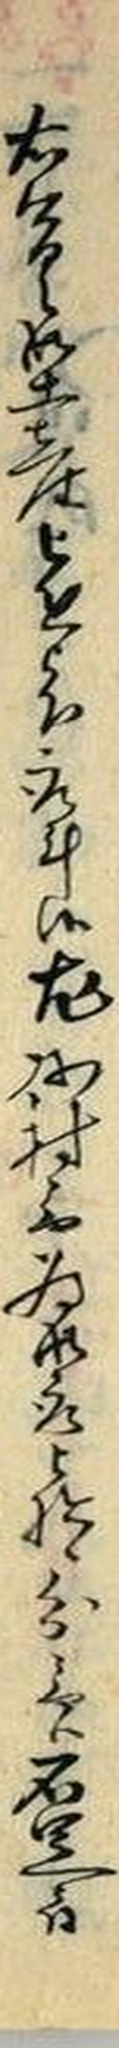右今日之御土産被進被下取斗候尤砂村ニ而為御取被遊候分ニ而ハ不足ニ付
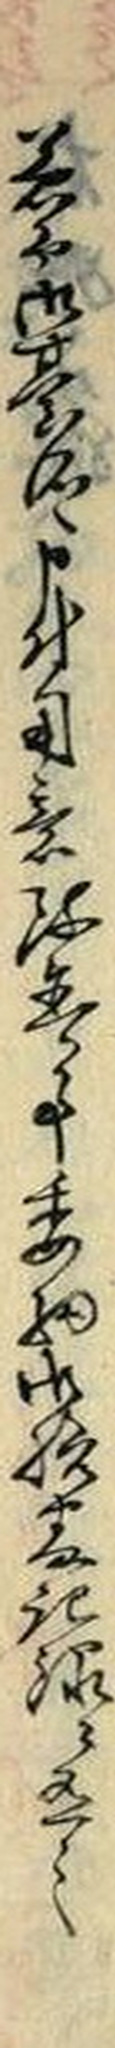兼而御台所へ申付用意致置候事委細御膳番記録ニ有之
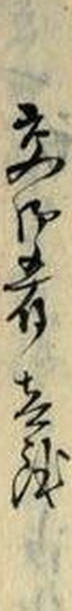交御肴壱鉢
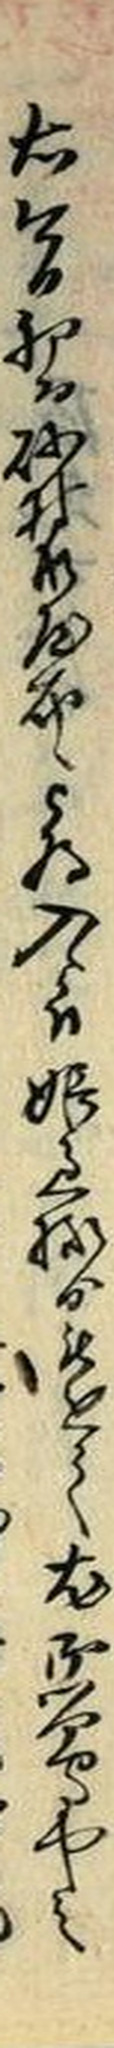右今日初而砂村御屋布へ被為入候ニ付姫君様ゟ被進之尤御留守中之
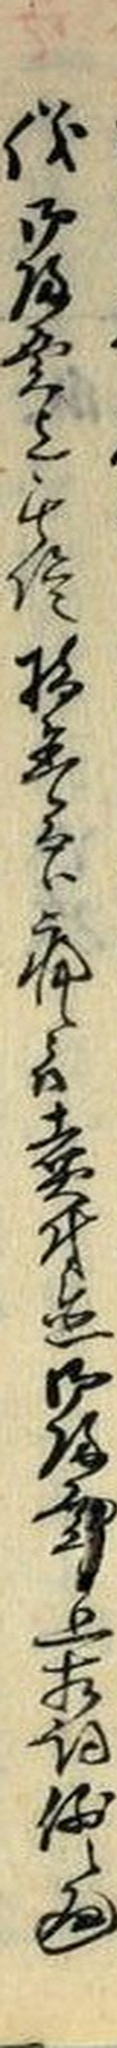儀御帰殿迄其侭指置候而ハ痛候ニ付煮付置御帰殿候上相伺例之通
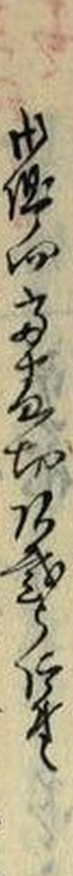御側向当番切頂戴被仰付候
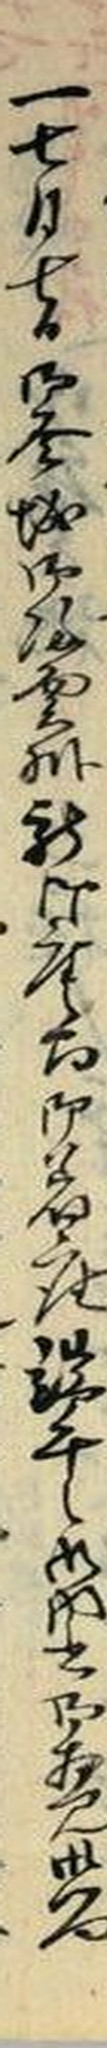一七月七日御登城御帰殿掛新御座之間御着座端午之御内書御拝見御留
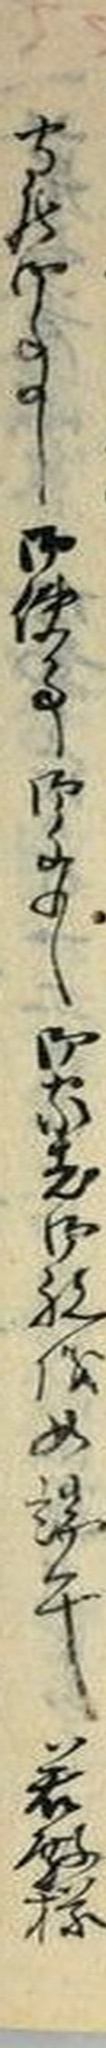守居御手のし御使事御手のし御家老御祝儀如端午若殿様
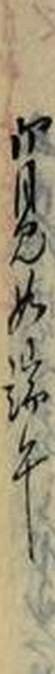御目見如端午
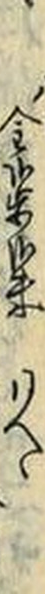金弐歩弐朱同人へ
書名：少傅日録抄（斉承付側向頭取日記、在府）
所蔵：福井県文書館 Fukui Prefectural Archives
